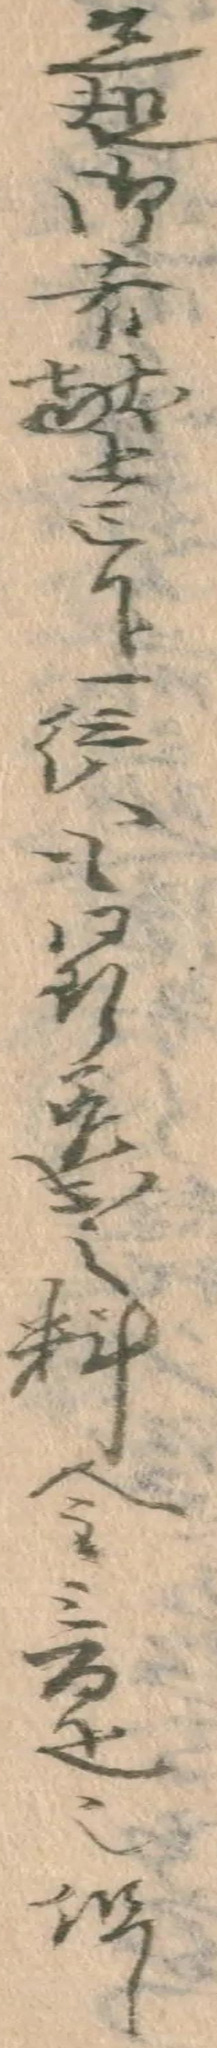先規御肴献上被下一統へも同断差出之料金三百疋也但し
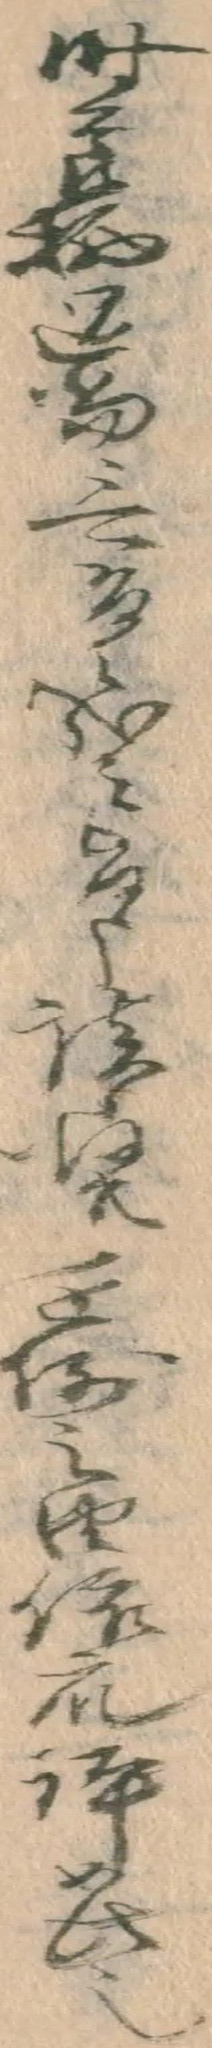時節柄退留ニ可有之哉之旨申談候得共延例之由依衆評如此也
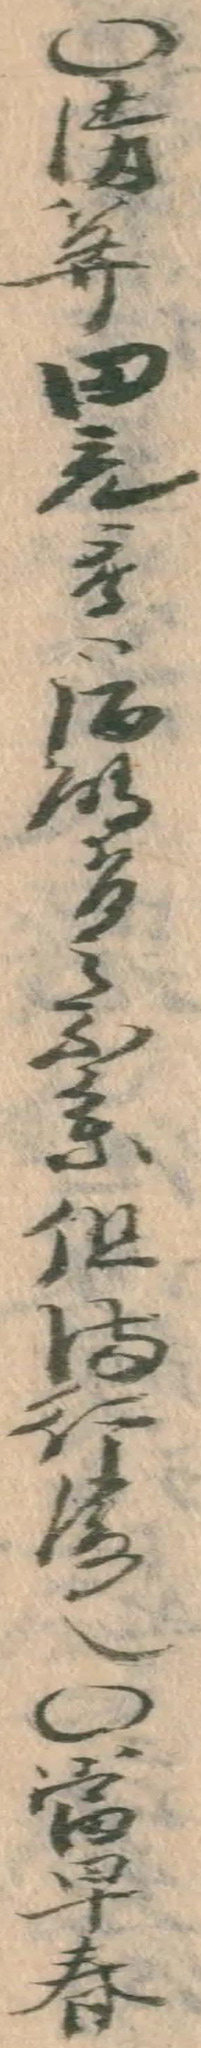◯清算田充二付御酒觸有之不参但満行後也○當早春
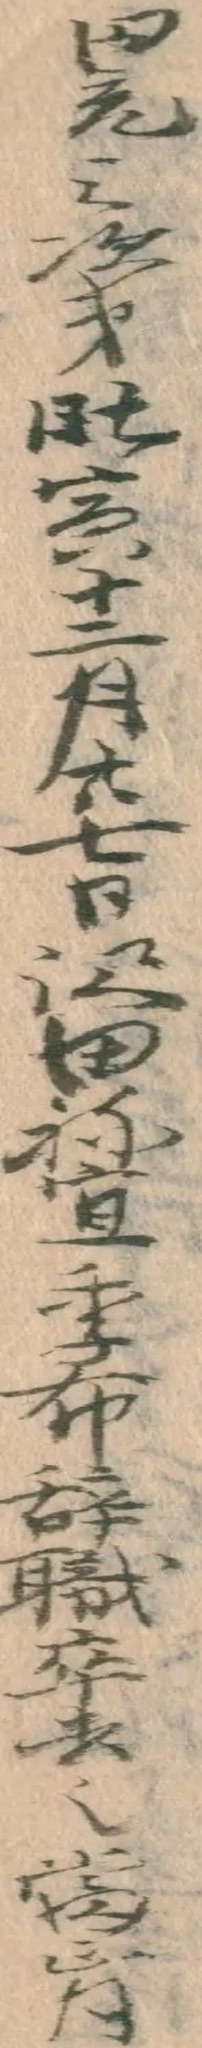田充之次第昨寅十二月廿七日沢田禰宜季布辞職卒去也當正月
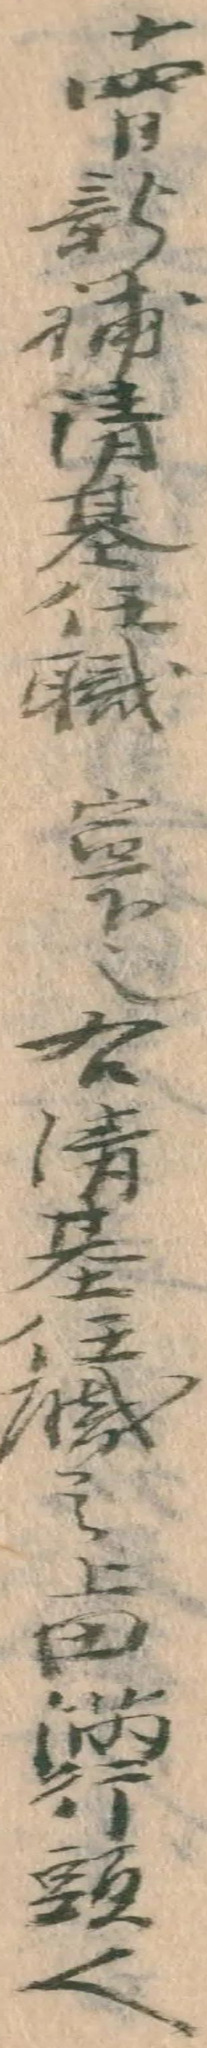十四日新補清基任職宣下也右清基任職之上田満行頭人
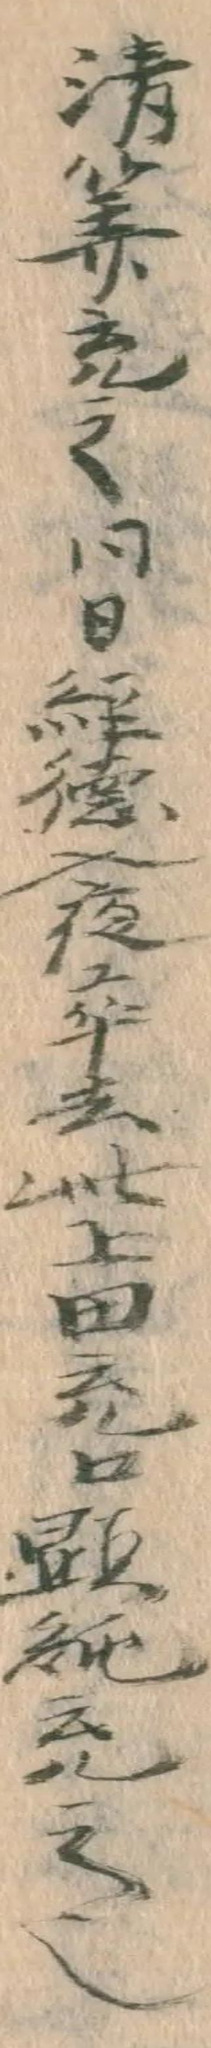清算充也同日経徳入夜卒去此上田充口顕純充之也
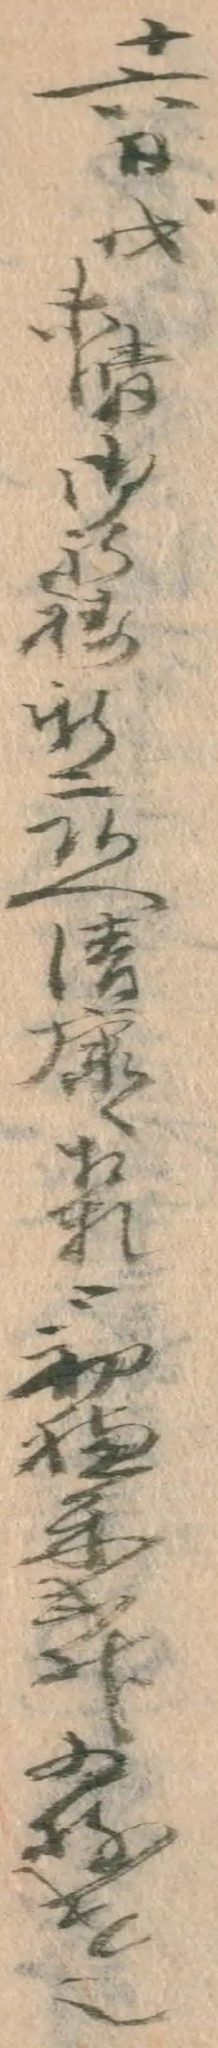十六日戌未晴御祈祷新二頭人清康へ相頼御初穂米二升為持遣也
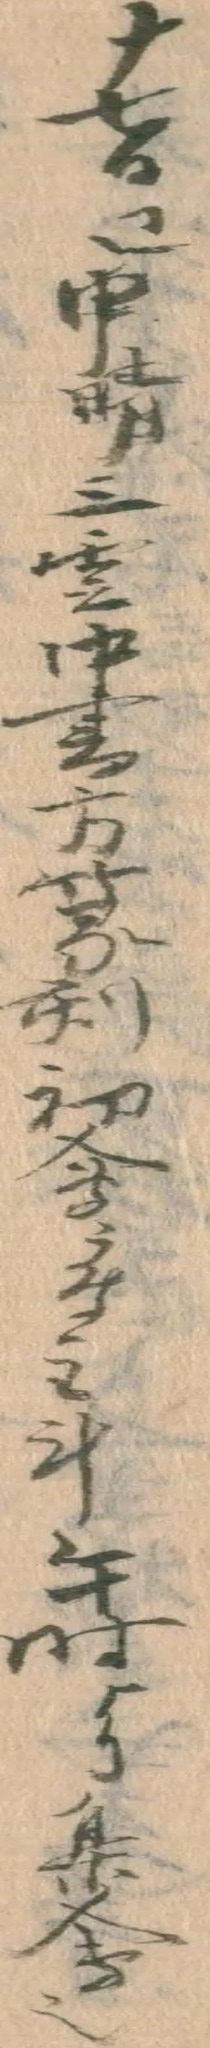十七日己申三雲中書方篆刻初會ニ付主斗午時より集會也
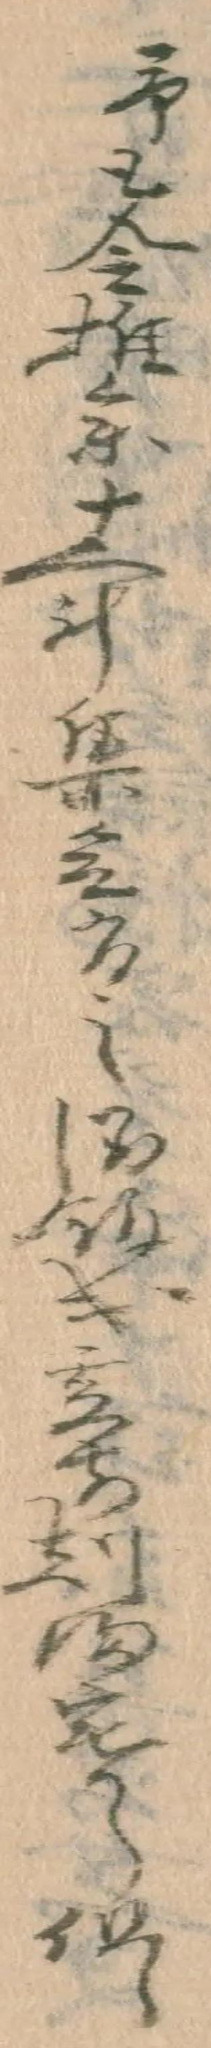予も令推参十人斗集會有之酒飯出亥前刻帰宅了但し
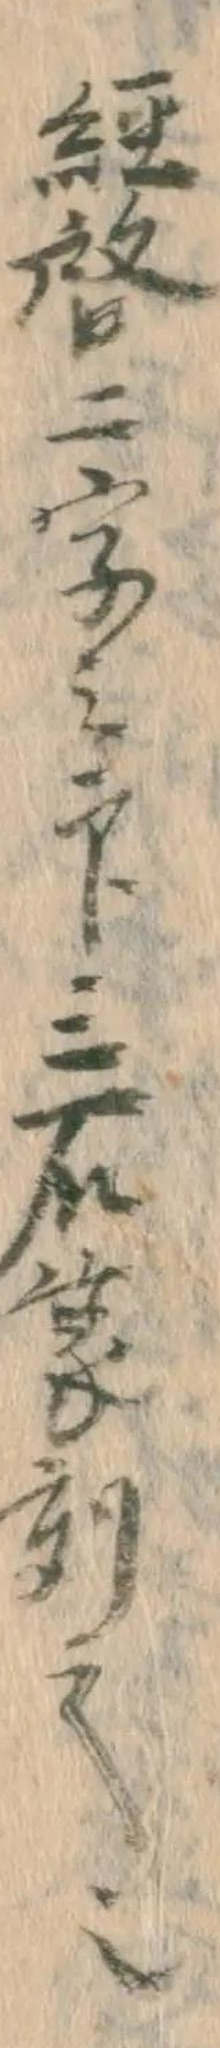経啓二字之印三石篆刻之也
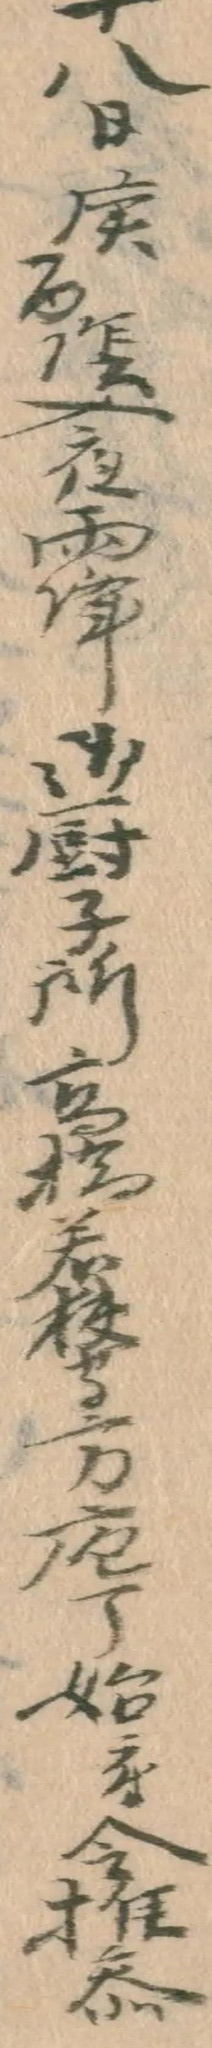十八日庚酉陰入夜雨降御厨子所高橋若狭守方包丁始ニ付令推参
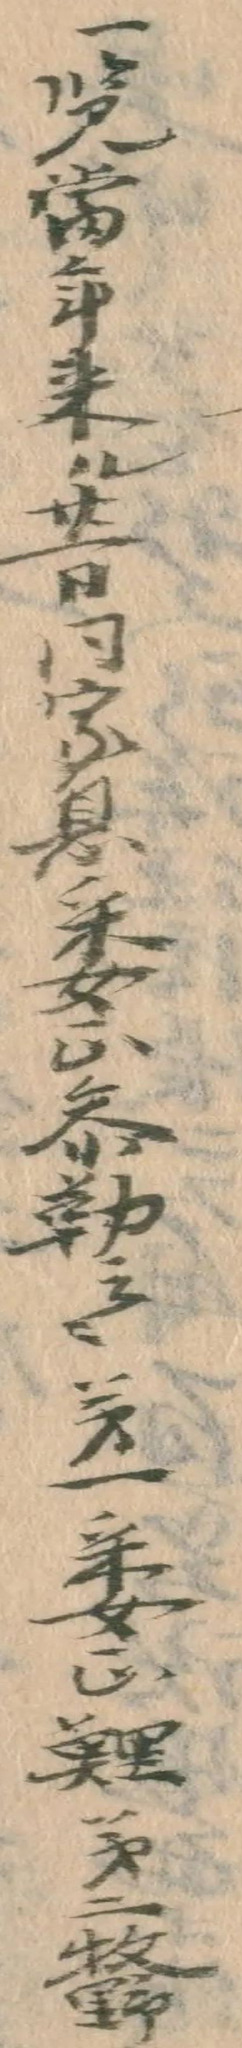一覧當年来ル廿一日同家息采女正参勤云々第一采女正鯉弟二牧野
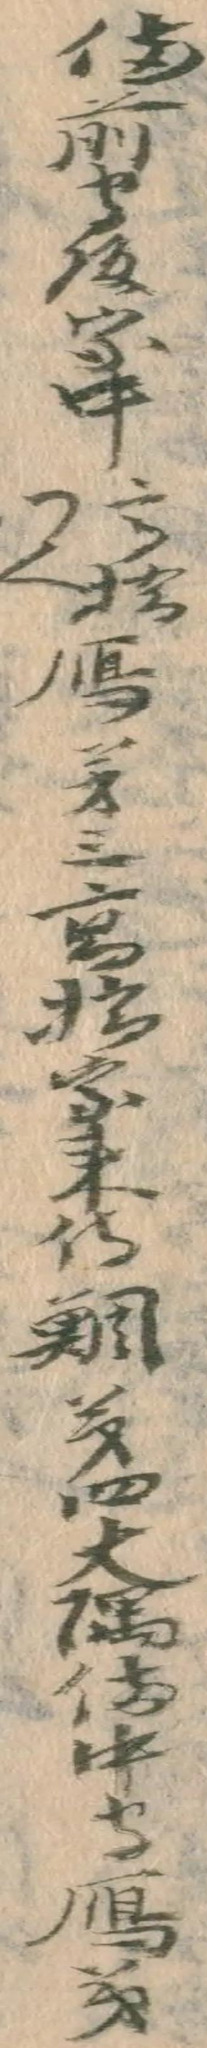備前守殿家中高橋同人鷹第三高橋家来侍鯛第四大隅備中守鷹弟
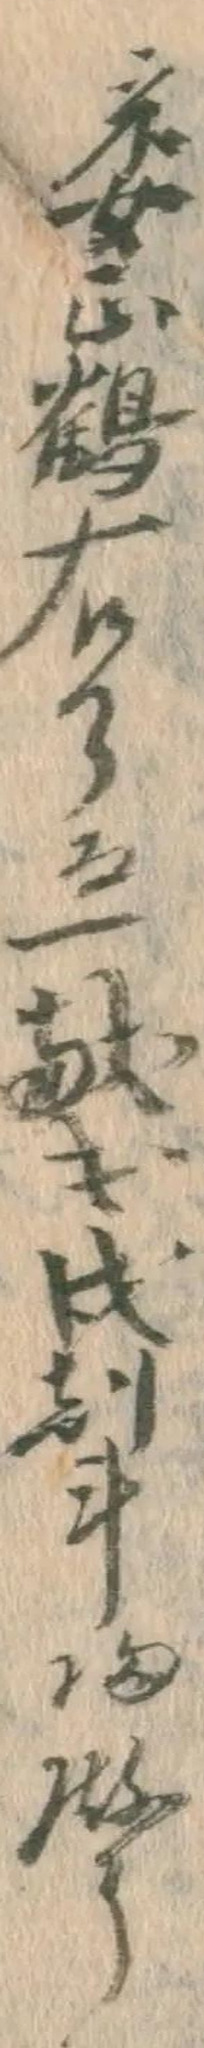采女正鶴右了而一献出戌刻斗帰殿了
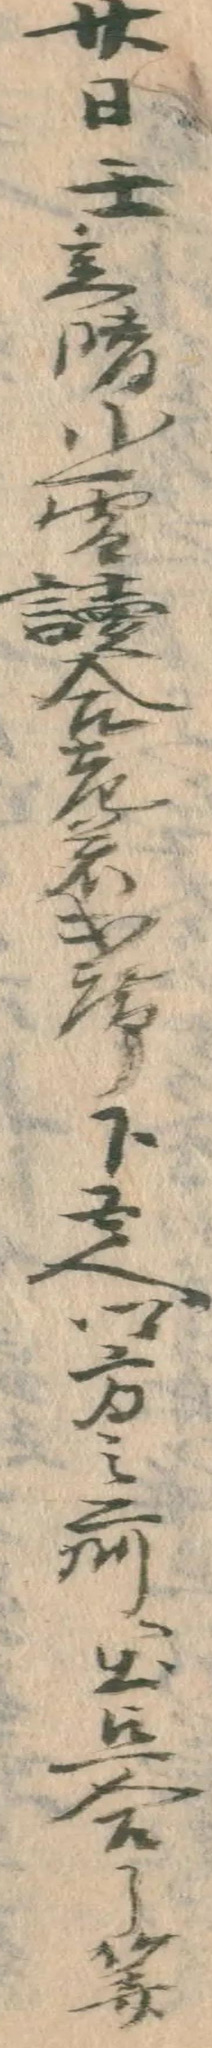廿日壬亥晴小雪讀合老若出席下五人閉方之前へ出点合之算
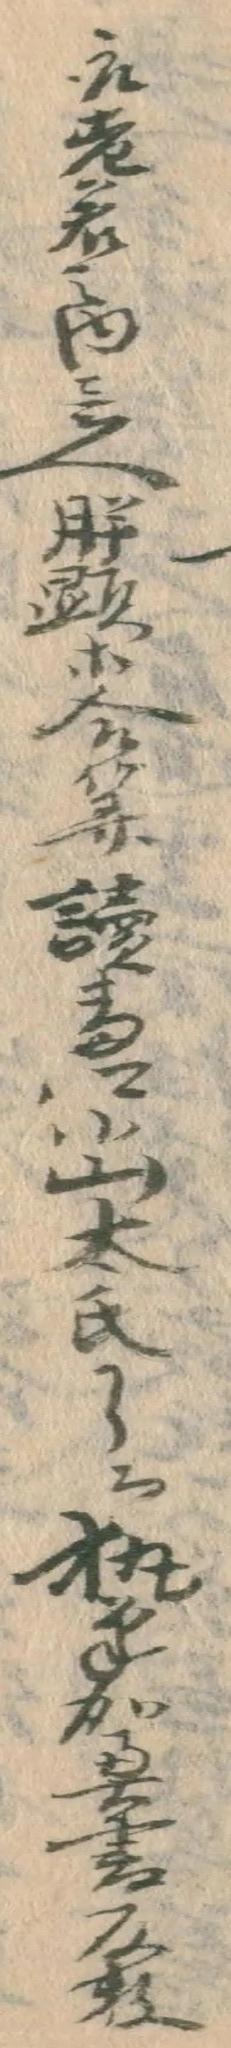取老若之内壱人胖顕等合算讀書郷小山太氏了而執筆加奥反数
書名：賀茂社記録. 第69冊
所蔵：国立国会図書館 National Diet Library, JAPAN
